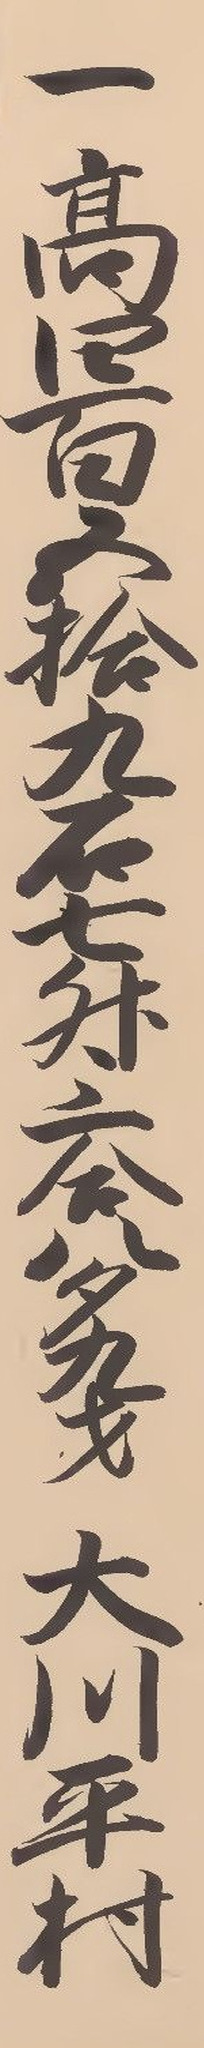一高四百五拾九石七升三合八勺九才大川平村
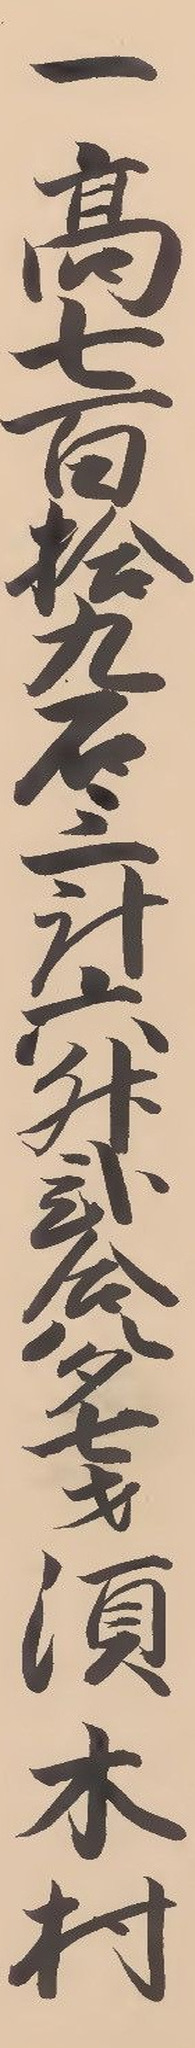一高七百拾九石三斗六升弐合八勺七才須木村

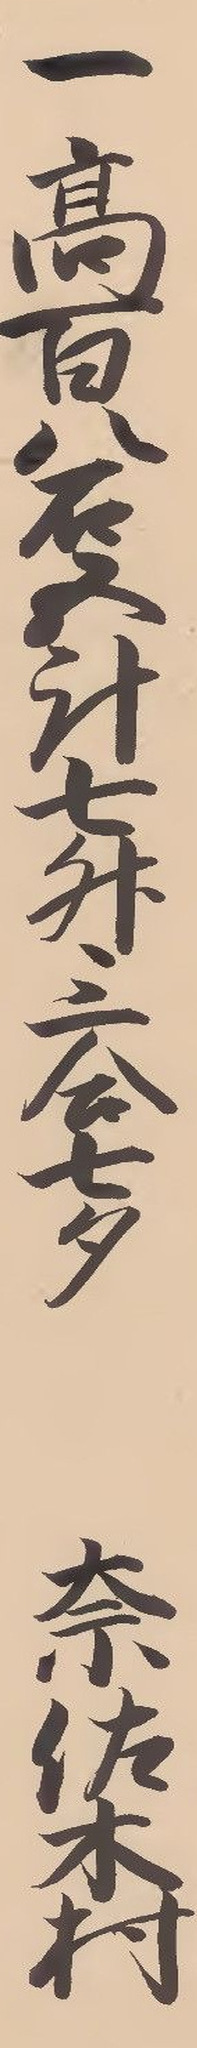一高百八石五斗七升三合七勺奈佐木村
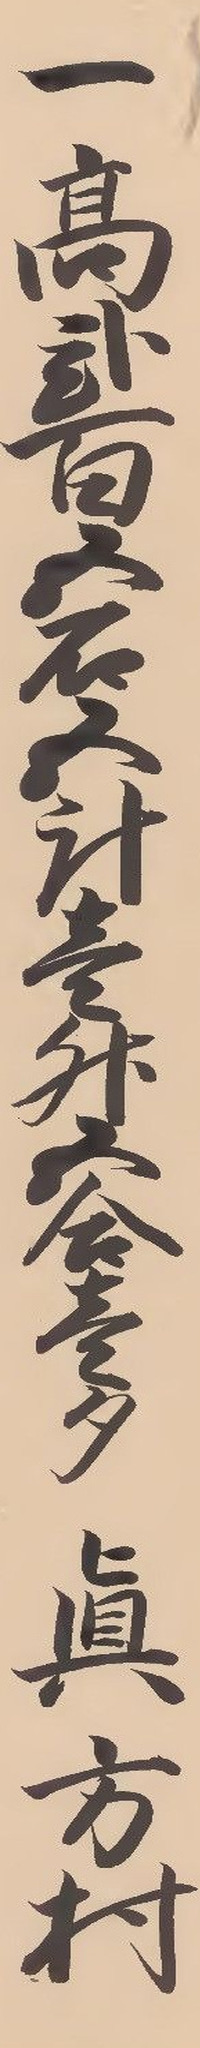一高弐百五石五斗壱升五合壱勺真方村
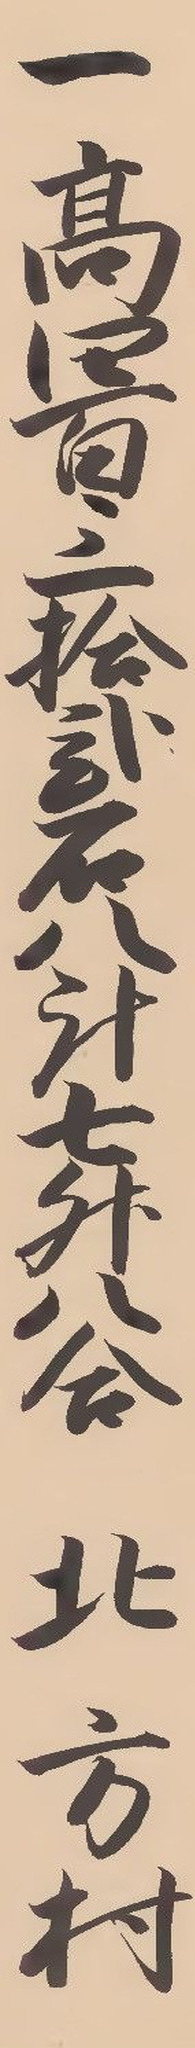一高四百三拾弐石八斗七升八合北方村
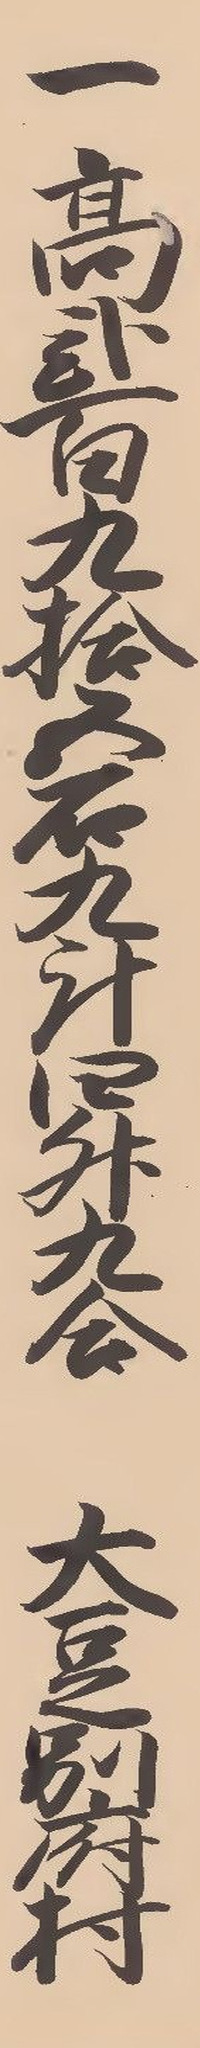一高弐百九拾五石九斗四升九合大豆別府村
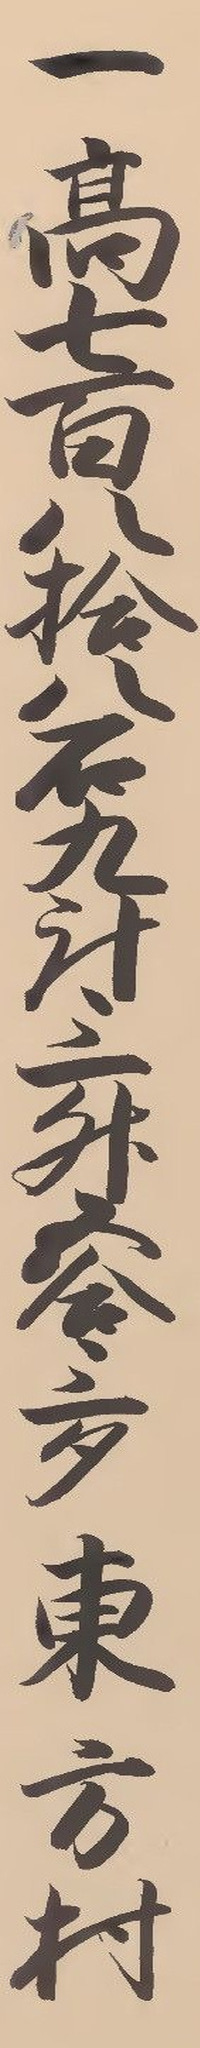一高七百八拾八石九斗三升五合三勺東方村
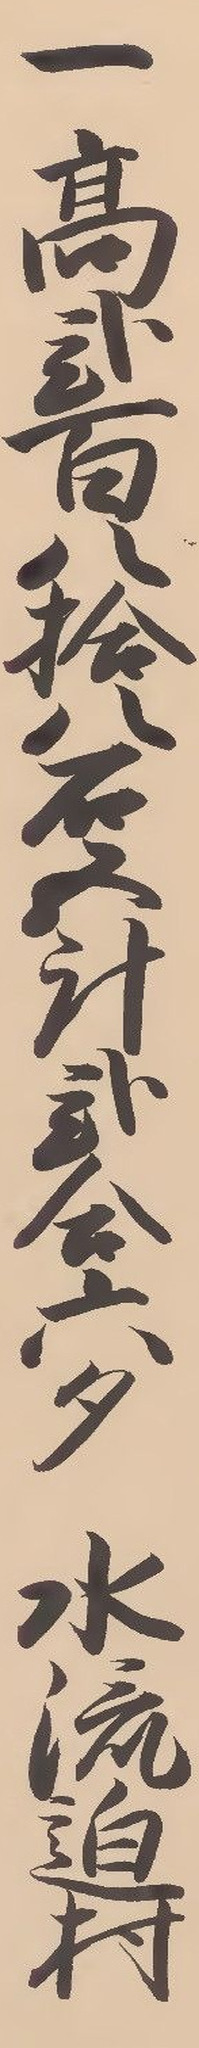一高弐百八拾八石五斗弐合六勺水流迫村
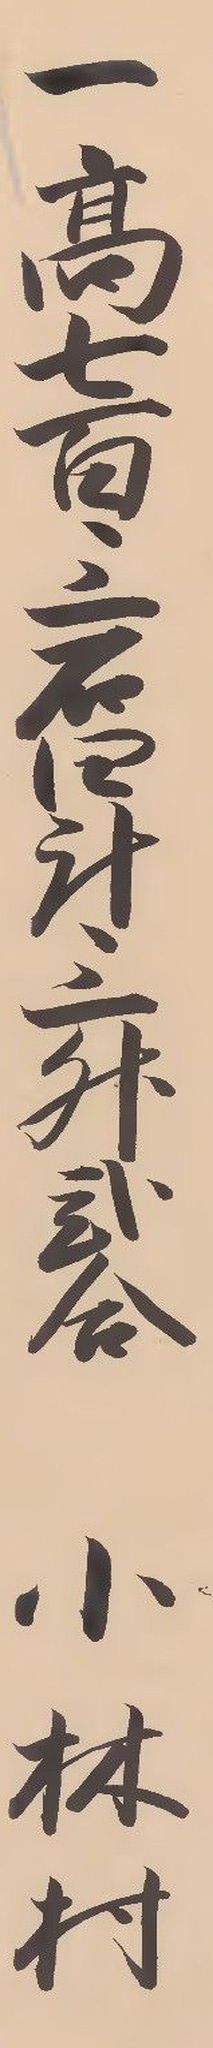一高七百三石四斗三升弐合小林村
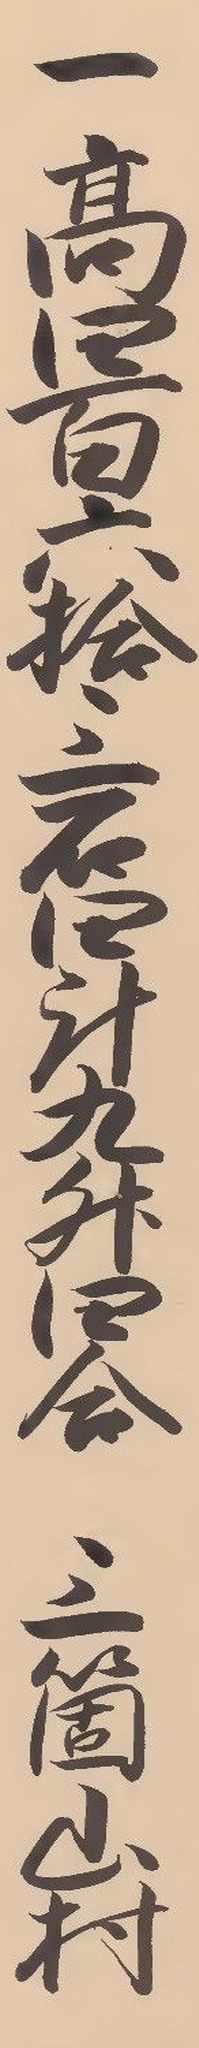一高四百六拾三石四斗九升四合三箇山村

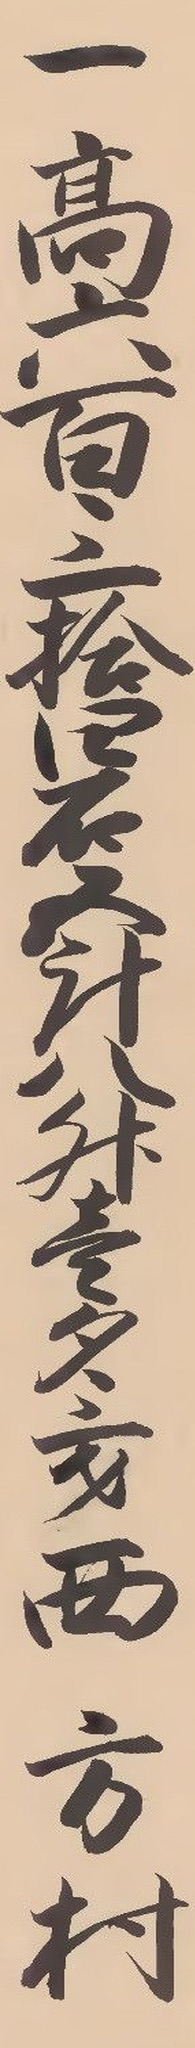一高六百三拾四石五斗八升壱勺三才西方村
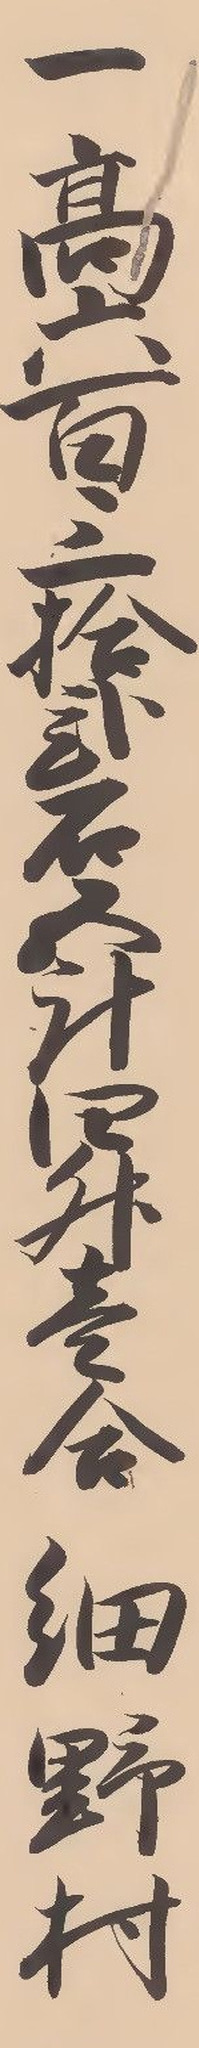一高六百三拾弐石五斗四升壱合細野村
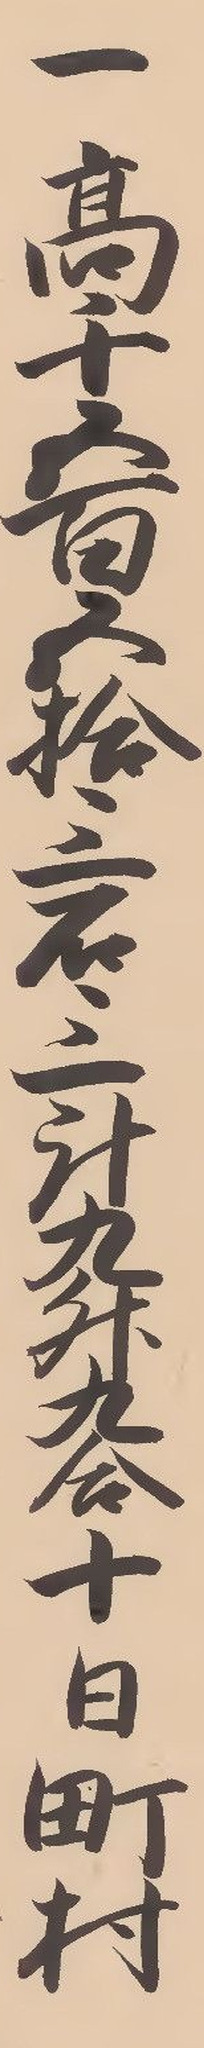一高千五百五拾三石三斗九升九合十日町村
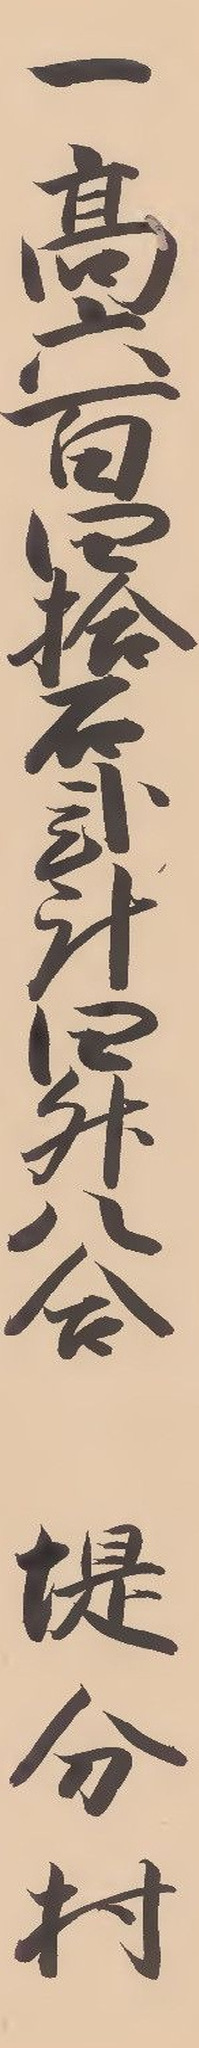一高六百四拾石弐斗四升八合堤分村
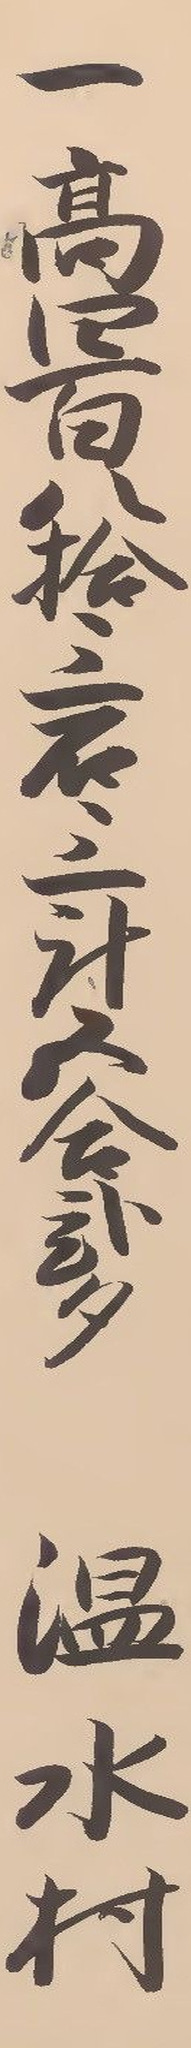一高四百八拾三石三斗五合弐勺温水村
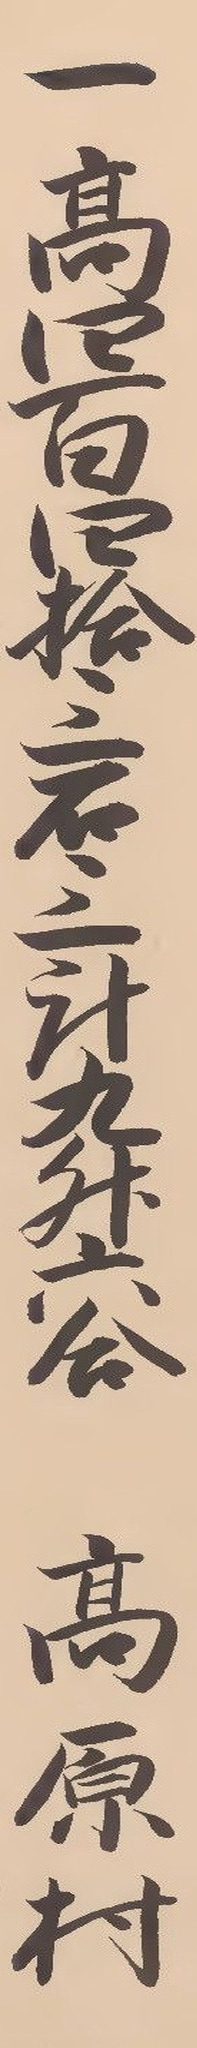一高四百四拾三石三斗九升六合高原村
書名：日向国郷帳
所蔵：国立公文書館 National Archives of Japan
